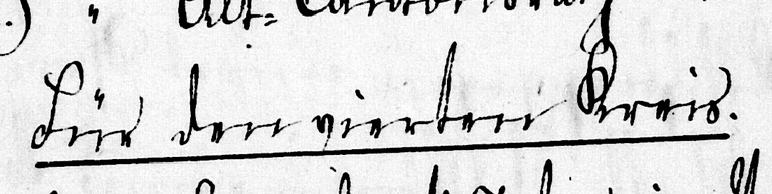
Für den vierten Kreis.
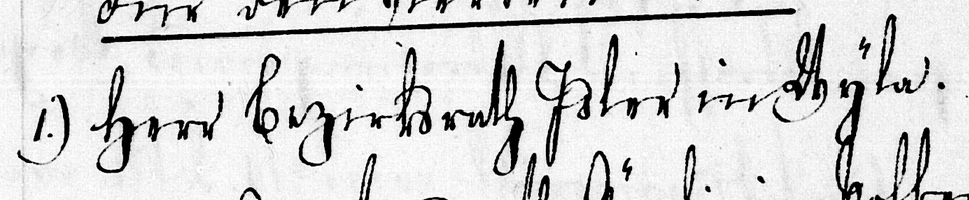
1.) Herr Bezirksrath Isler in Wyla.
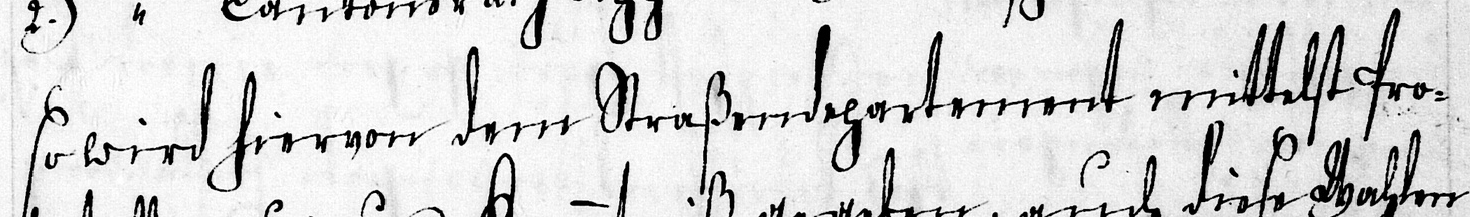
so wird hiervon dem Straßendepartement mittelst Pro¬
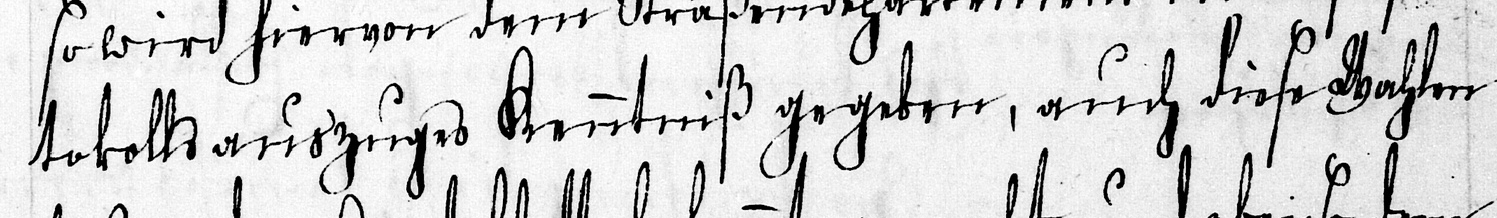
tokollsauszuges Kenntniß gegeben, auch diese Wahlen
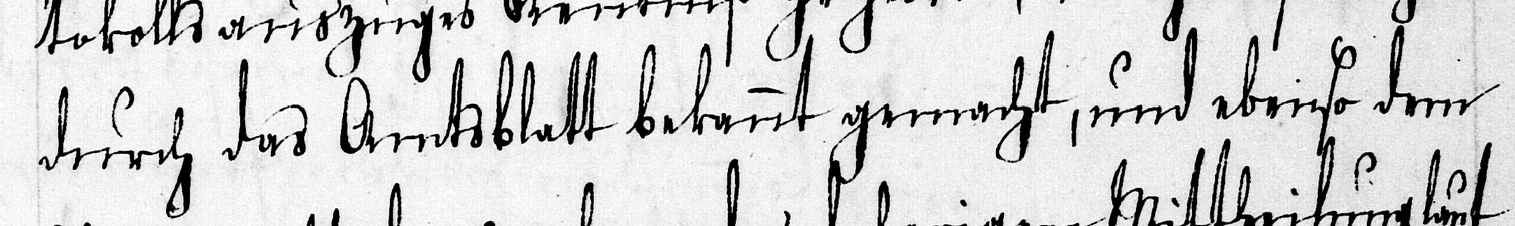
durch das Amtsblatt bekannt gemacht, und ebenso dem
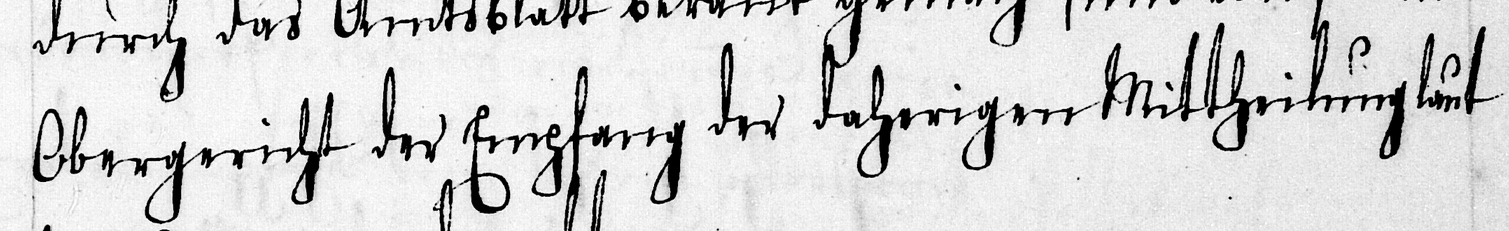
Obergericht der Empfang der daherigen Mittheilung laut
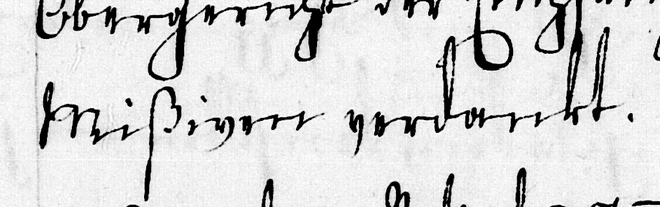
Mißiven verdankt.
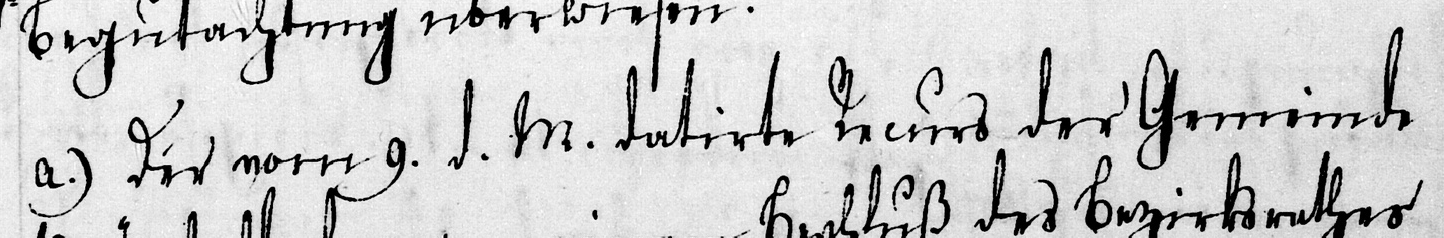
a.) Der vom 9. d. M. datirte Recurs der Gemeinde
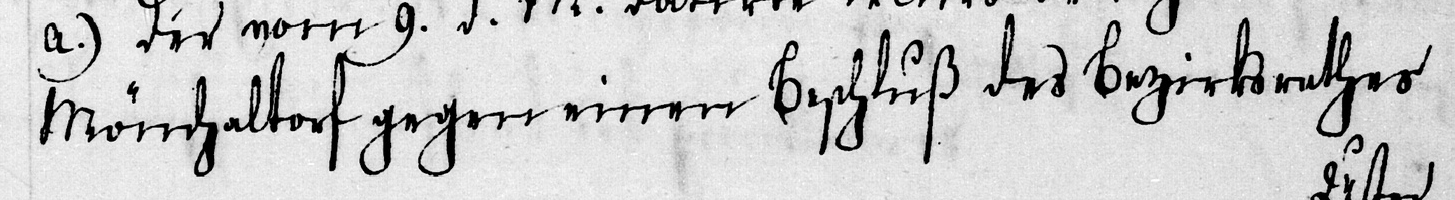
Mönchaltorf gegen einen Beschluß des Bezirksrathes
